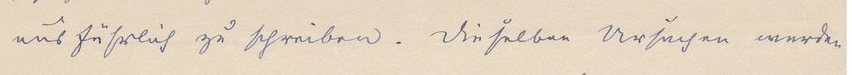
ausführlich zu schreiben. Dieselben Ursachen werden
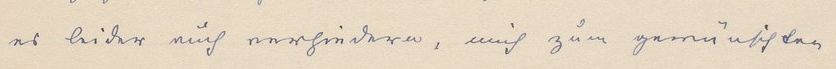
es leider auch verhindern, mich zum gewünschten
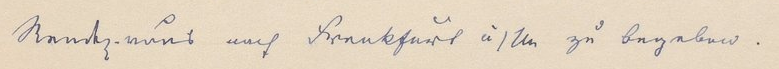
Rendez-vous nach Frankfurt a/M zu begeben.
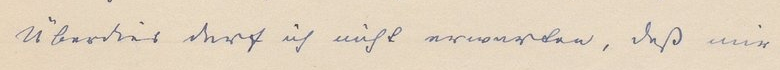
Überdies darf ich nicht erwarten, daß mir
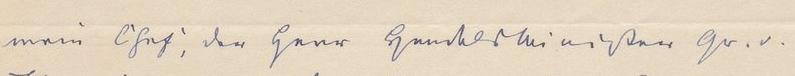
mein Chef, der Herr Handelsminister Gr.
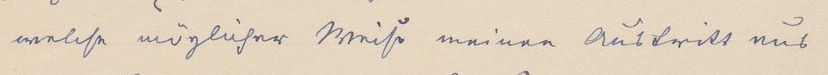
welche möglicherweise meinen Austritt aus
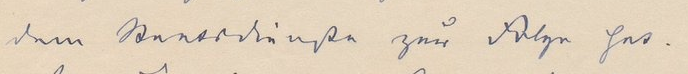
dem Staatsdienst zur Folge hat.
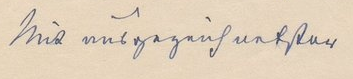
Mit ausgezeichnetster
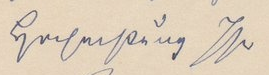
Hochachtung Ihr
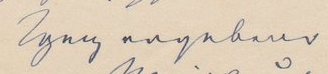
ganz ergebener
